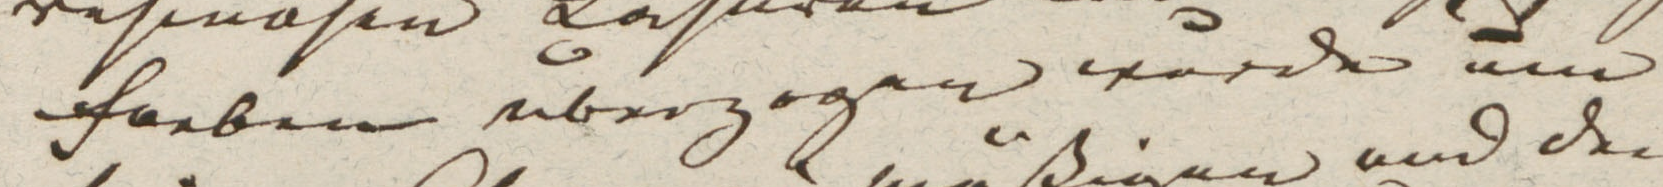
Farben überzogen wurde um
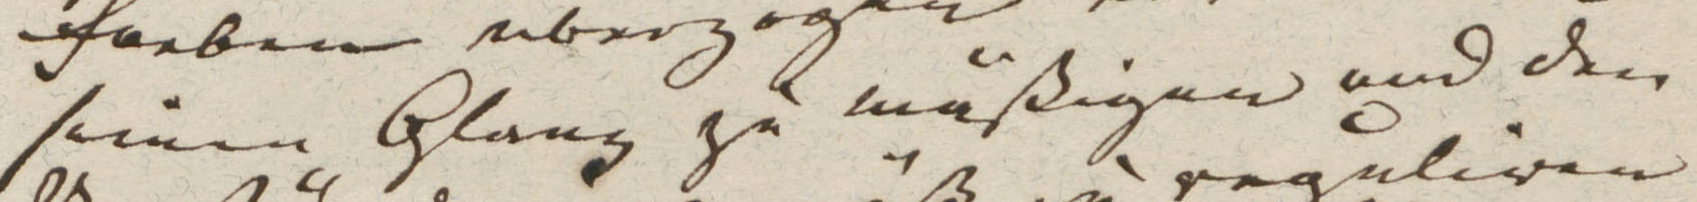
seinen Glanz zu mässigen und den
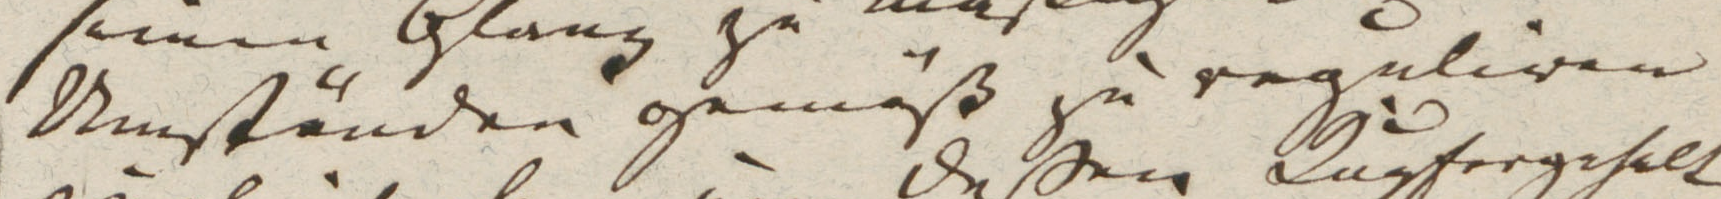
Umständen gemäss zu reguliren
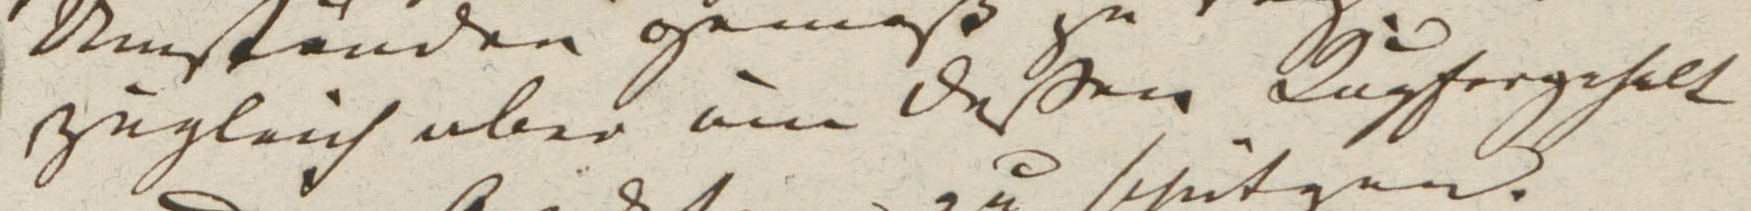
zugleich aber um dessen Kupfergehalt
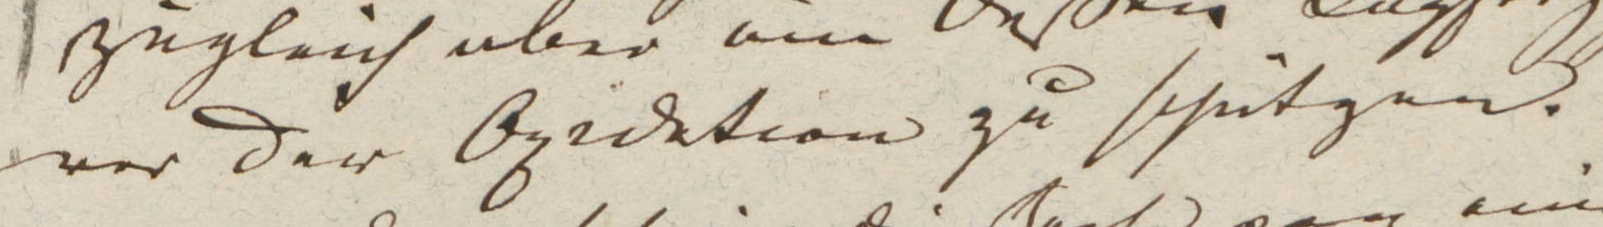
vor der Oxidation zu schützen.
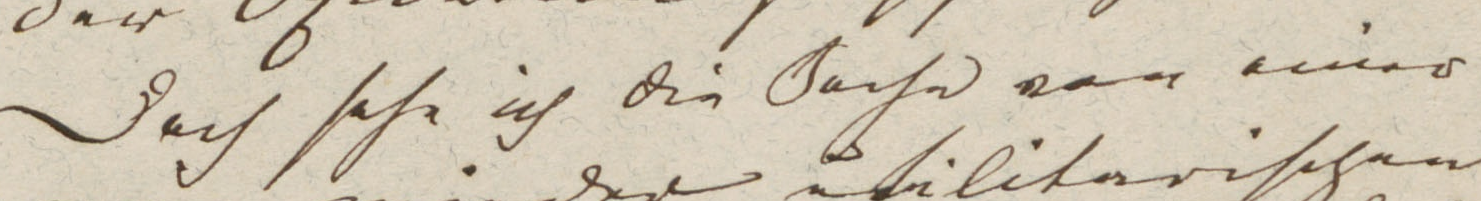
Doch sehe ich die Sache von einer
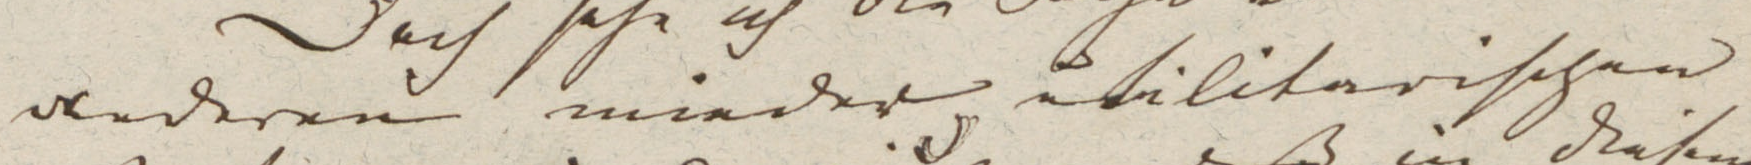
anderen minder utilitarischen
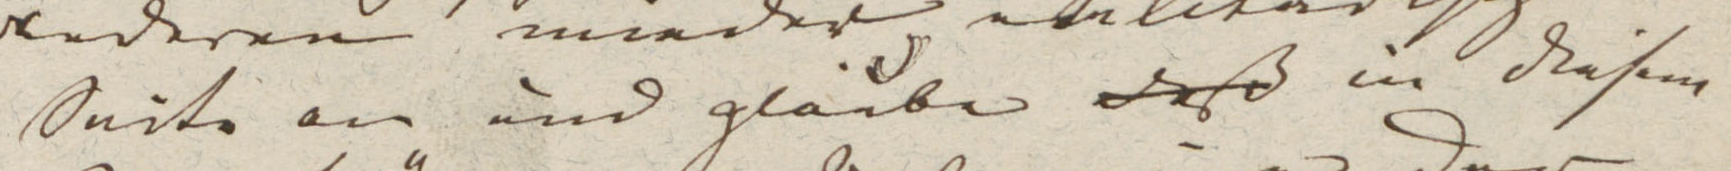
Seite an und glaube dass in diesem
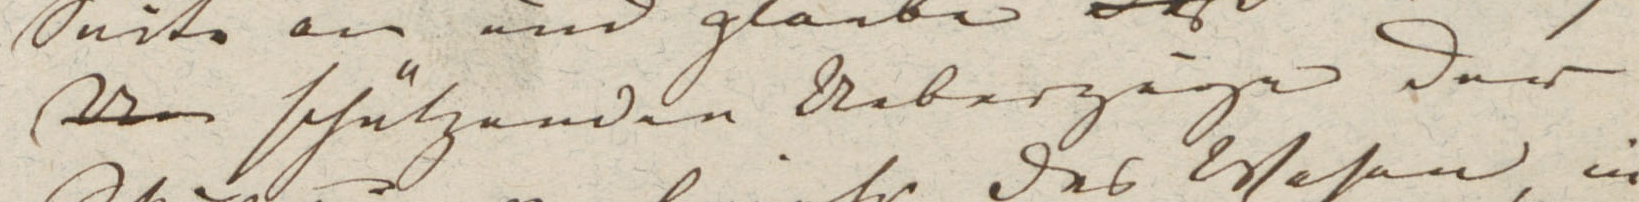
Ur schützenden Ueberzuge der
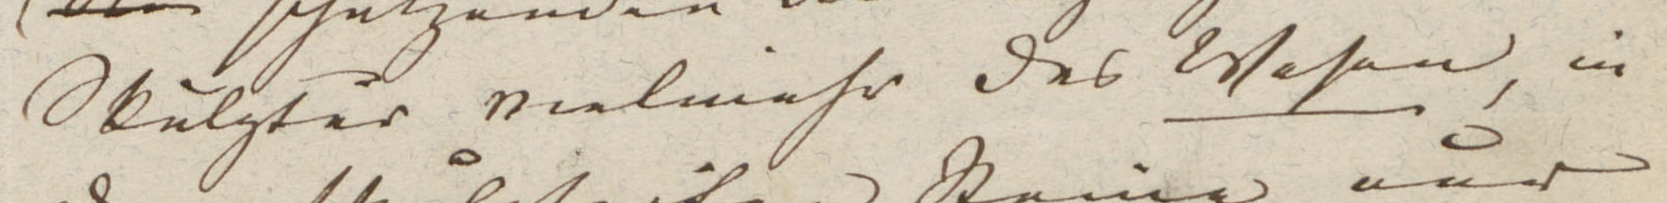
Skulptur vielmehr das Wesen, in
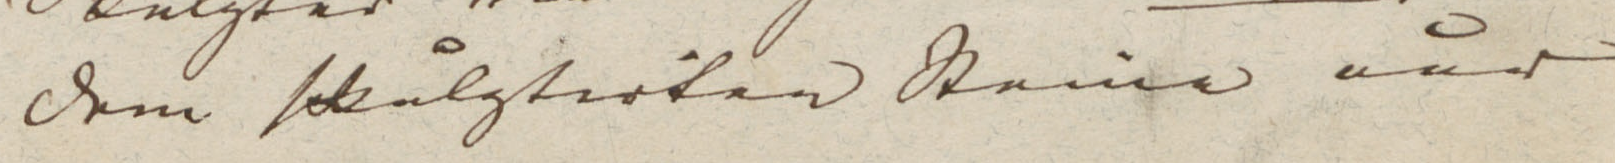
dem skulptirten Steine nur
